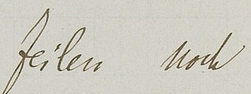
Ende um Ihnen
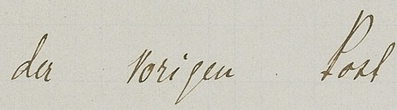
der vorigen Post
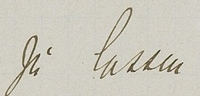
zu lassen.
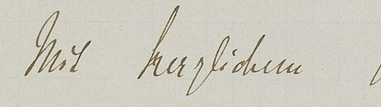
Mit herzlichem
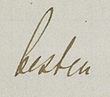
besten
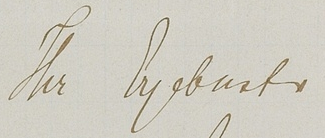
Ihr Ergebnster
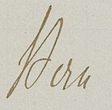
Welti
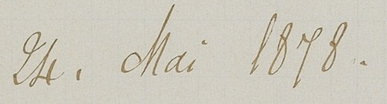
24. Mai 1878.
